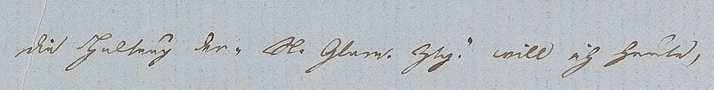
Die Haltung der «N. Glarn. Ztg.» will ich heute,
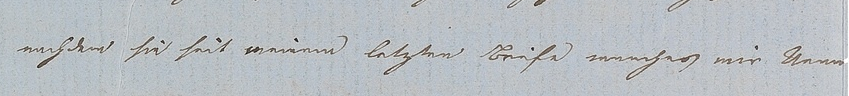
nachdem sie seit meinem letzten Briefe manches mir Unan-
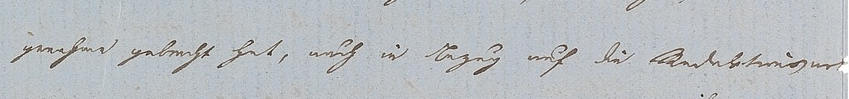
genehme gebracht hat, auch in Bezug auf die Redaktionsarti-
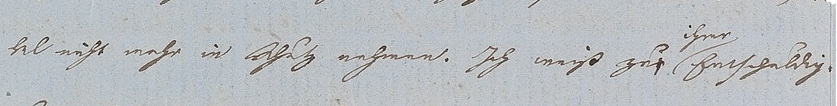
kel nicht mehr in Schutz nehmen. Ich weiß zu ihrer Entschuldig-
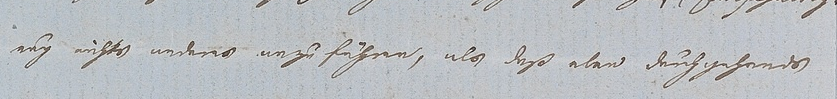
ung nichts anderes anzuführen, als daß eben durchgehends
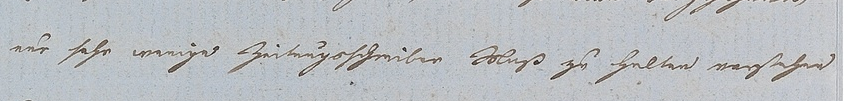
nur sehr wenige Zeitungsschreiber Maß zu halten verstehen
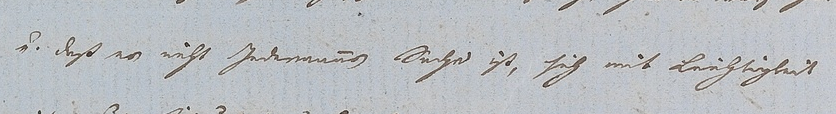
u. daß es nicht Jedermanns Sache ist, sich mit Leichtigkeit
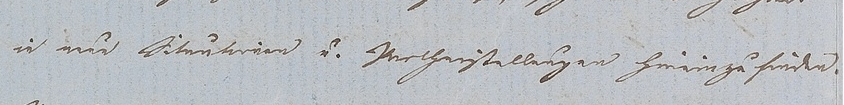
in neue Situationen u. Partheistellungen hineinzufinden.
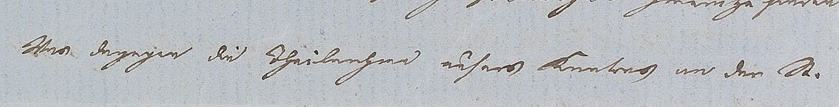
Was dagegen die Theilnahme unsers Kantons an der St.
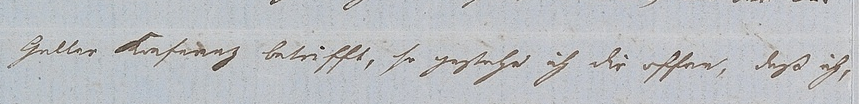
Galler Konferenz betrifft, so gestehe ich Dir offen, daß ich,
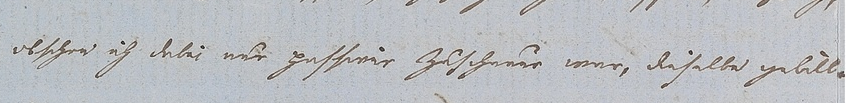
obschon ich dabei nur passiver Zuschauer war, dieselbe gebill-
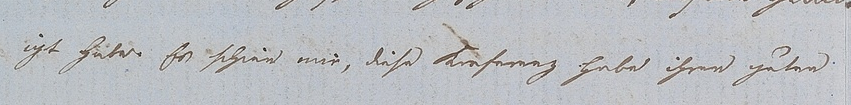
igt habe. Es schien mir, diese Konferenz habe ihren guten
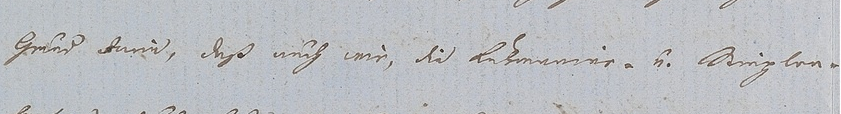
Grund darin, daß auch wir, die Lukmanier- u. Simplon -
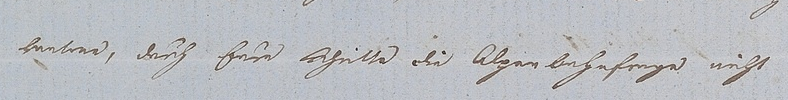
kantone, durch Eure Schritte die Alpenbahnfrage nicht
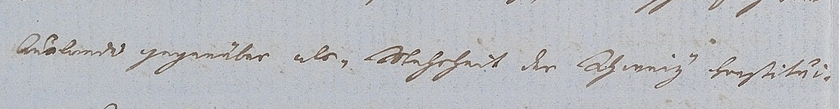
Auslande gegenüber als «Mehrheit der Schweiz» konstitui-
